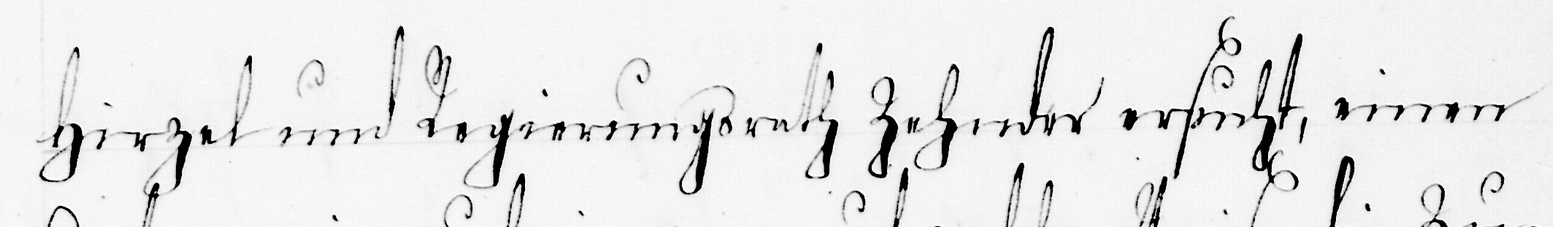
Hirzel und Regierungsrath Zehnder ersucht, einen
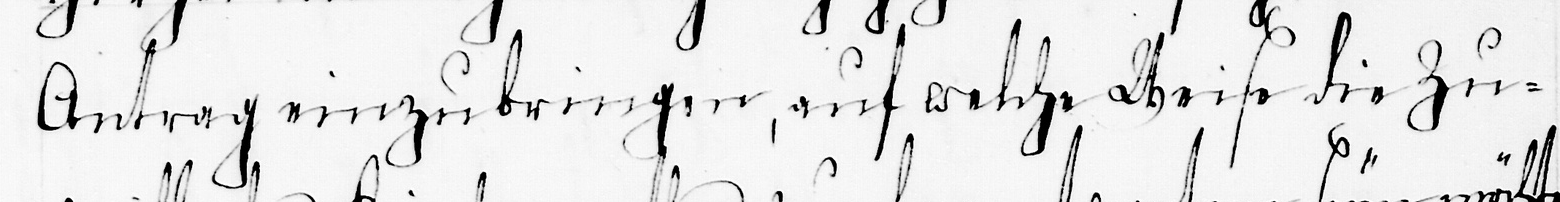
Antrag einzubringen, auf welche Weise die Zu¬
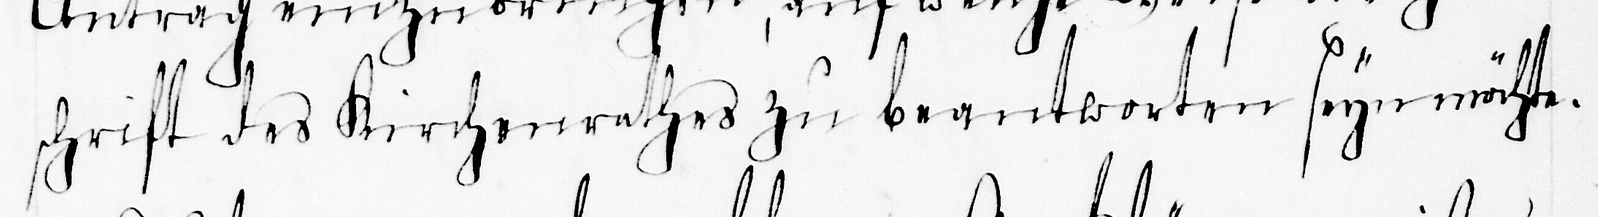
schrift des Kirchenrathes zu beantworten seyn möchte.
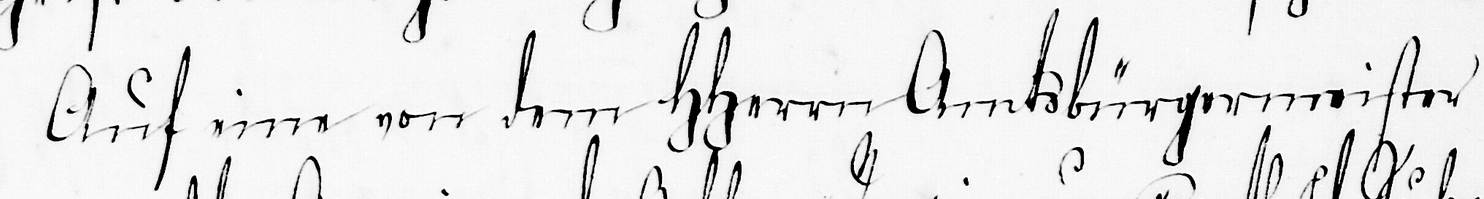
Auf eine von dem HHerrn Amtsbürgermeister
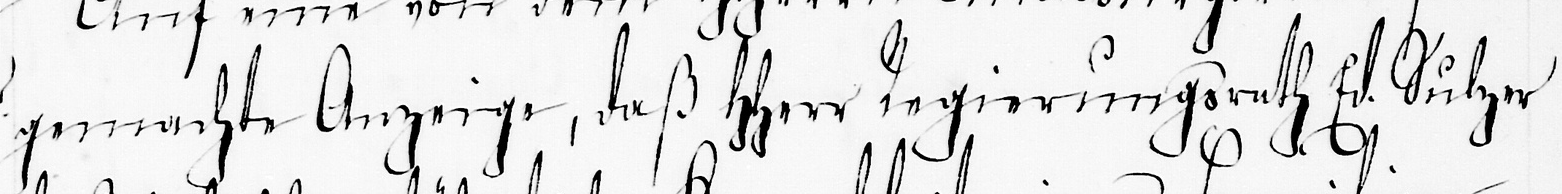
gemachte Anzeige, daß HHerr Regierungsrath Ed. Sulzer
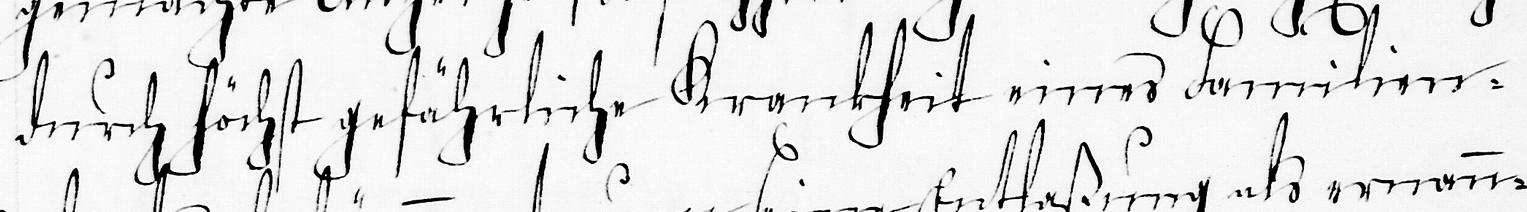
durch höchst gefährliche Krankheit eines Familien¬
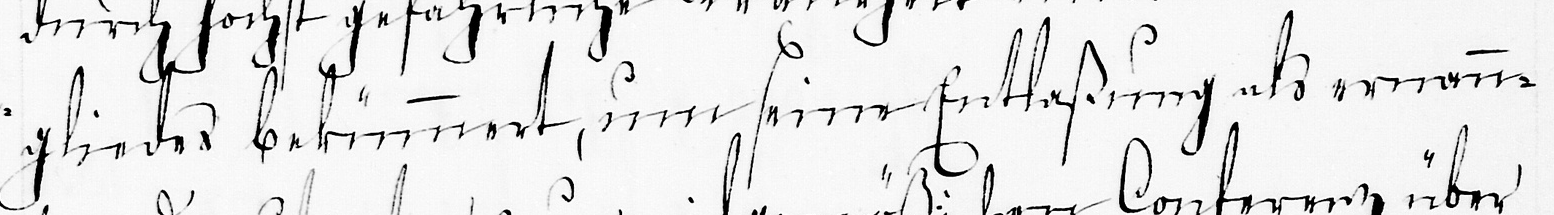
gliedes bekümmert, um seine Entlaßung als ernann¬
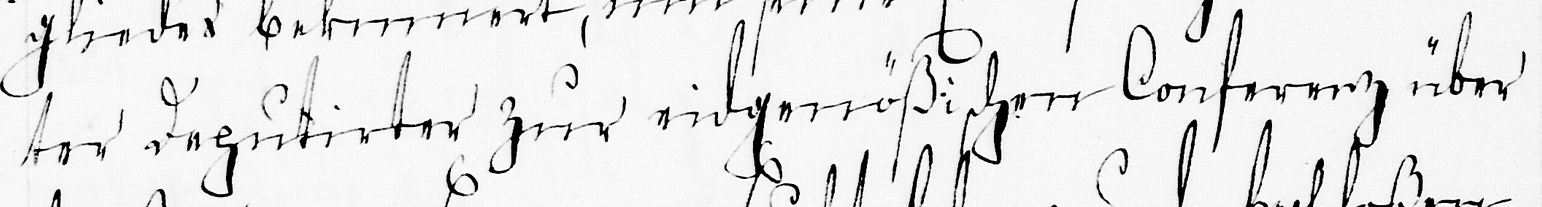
ter Deputirter zur eidgenößischen Conferenz über
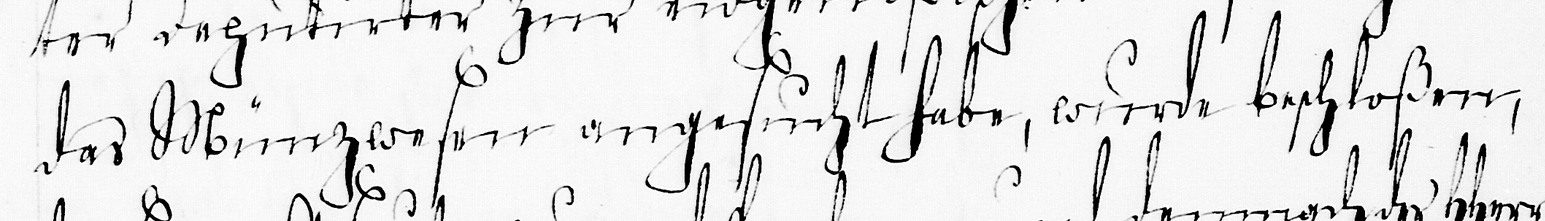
das Münzwesen angesucht habe, wurde beschloßen,
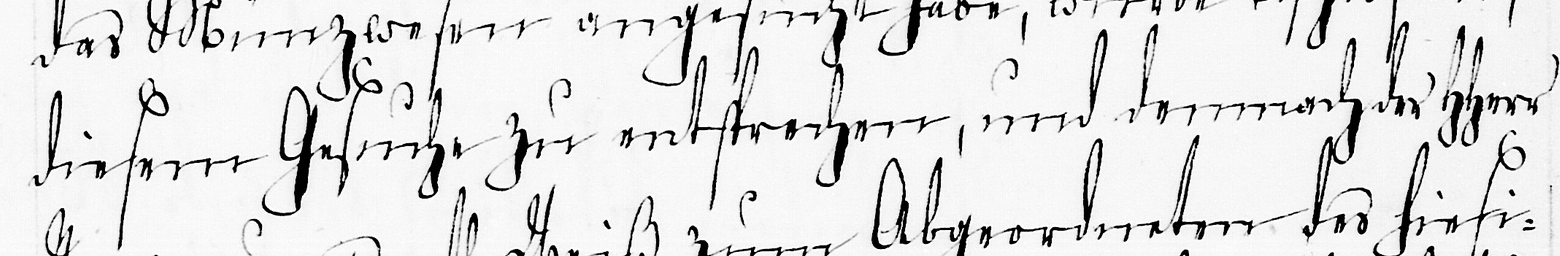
diesem Gesuche zu entsprechen, und demnach der
